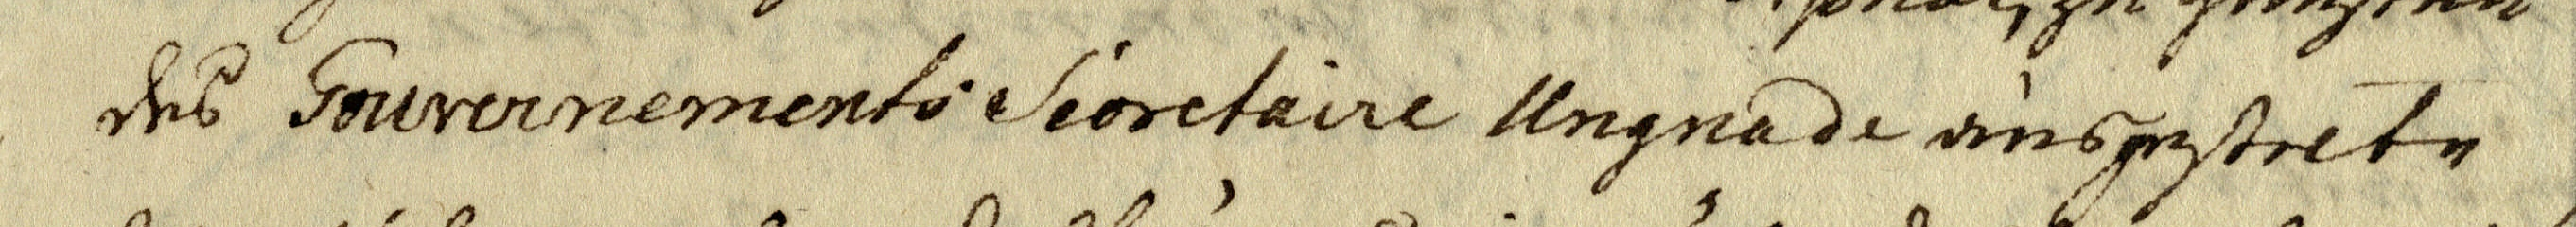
des Gouvernements Secretaire Ungnade ausgestelte
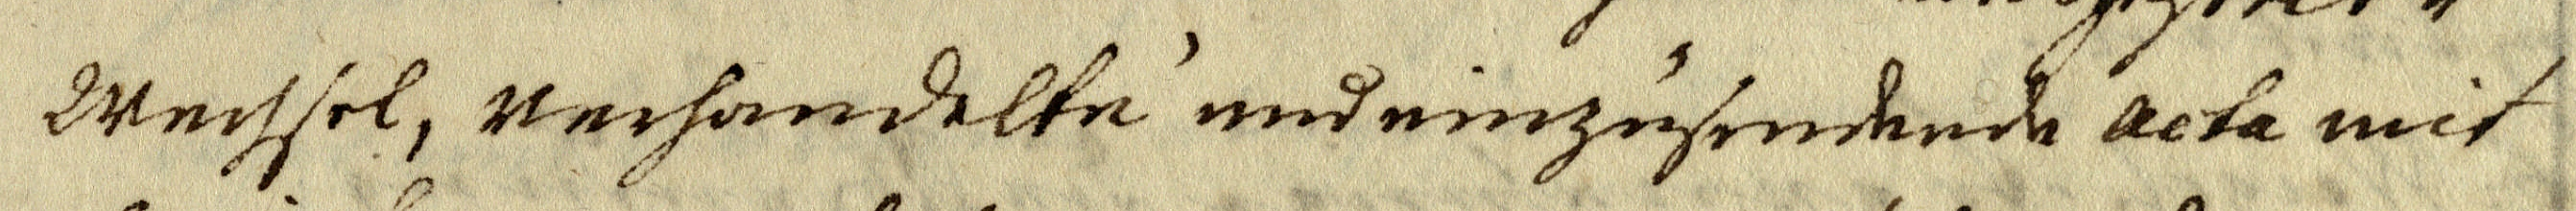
Wechsel, verhandelte und einzusendende Acta mit
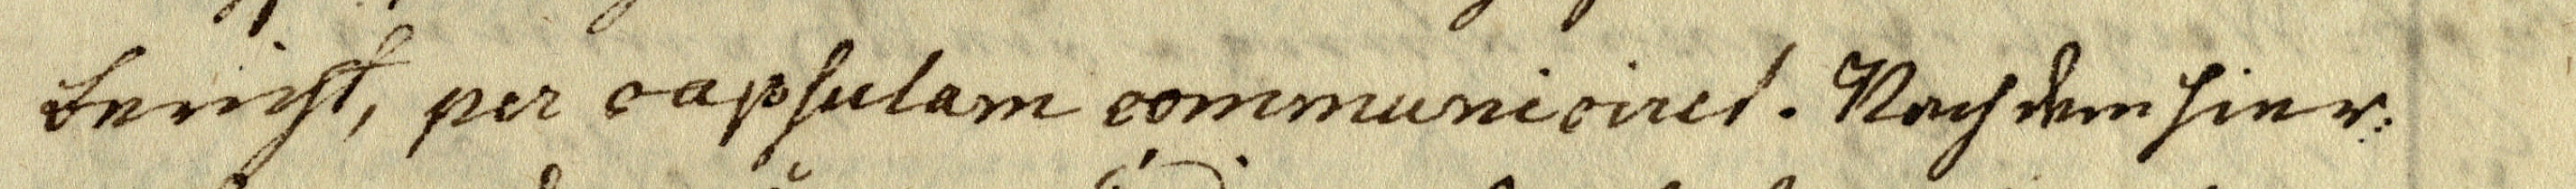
Bericht, per capsulam communiciret. Nachdem hier¬
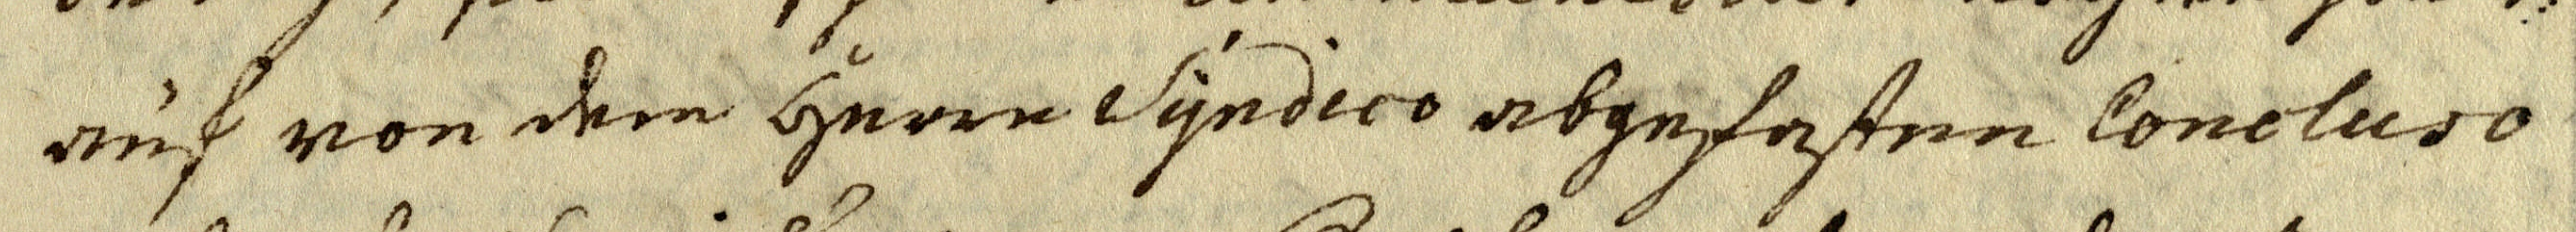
auf von dem Herrn Sÿndico abgefasten Concluso
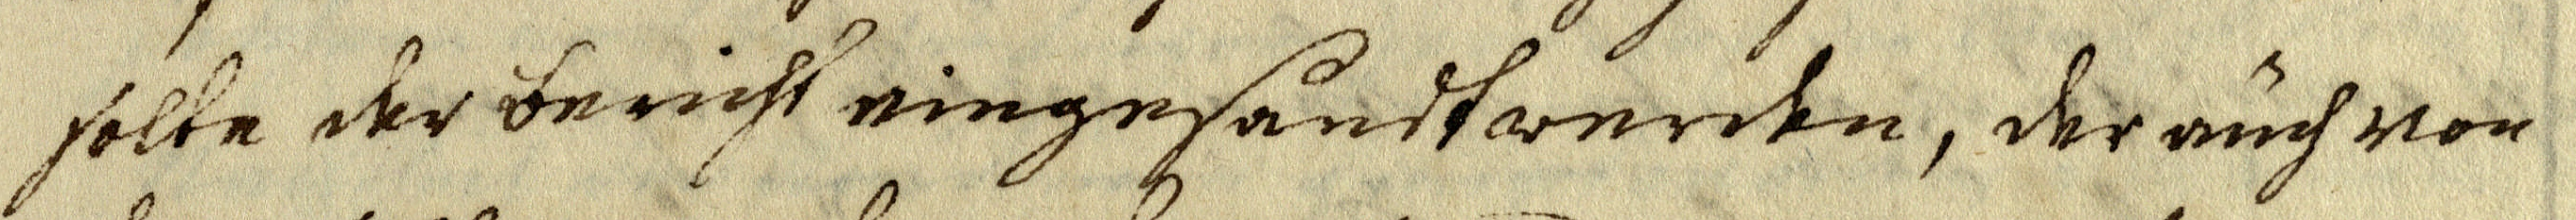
solte der Bericht eingesandt werden, der auch von
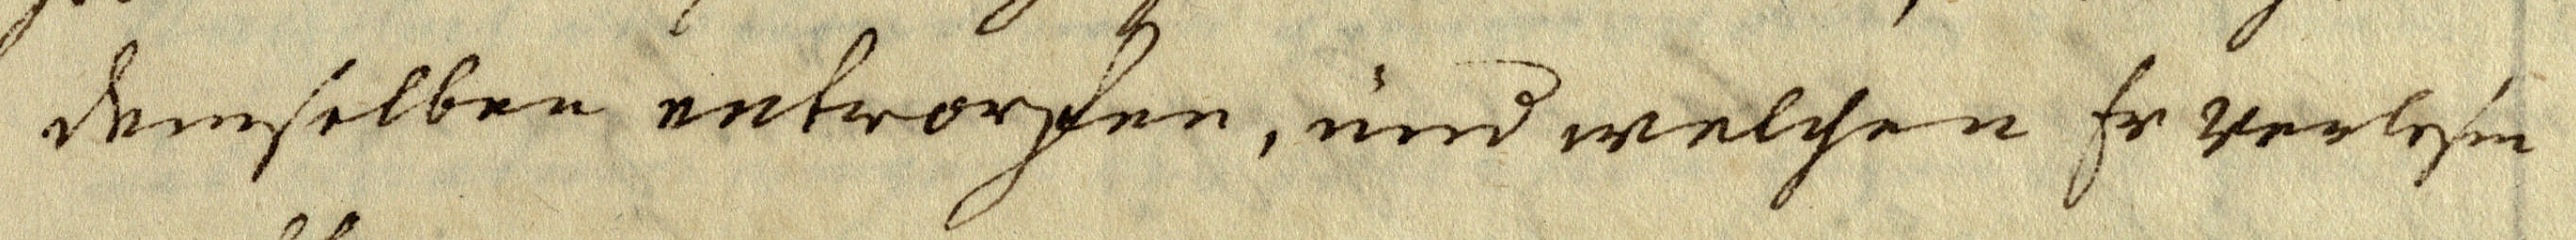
demselben entworfen, und welchen Er verlesen
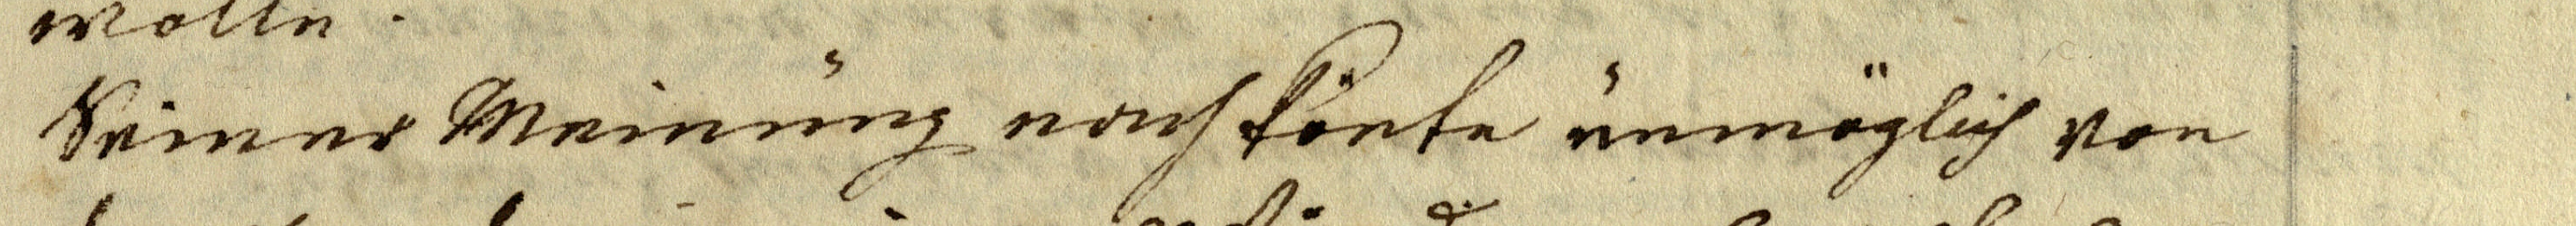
Seiner Meinung nach könnte unmöglich von
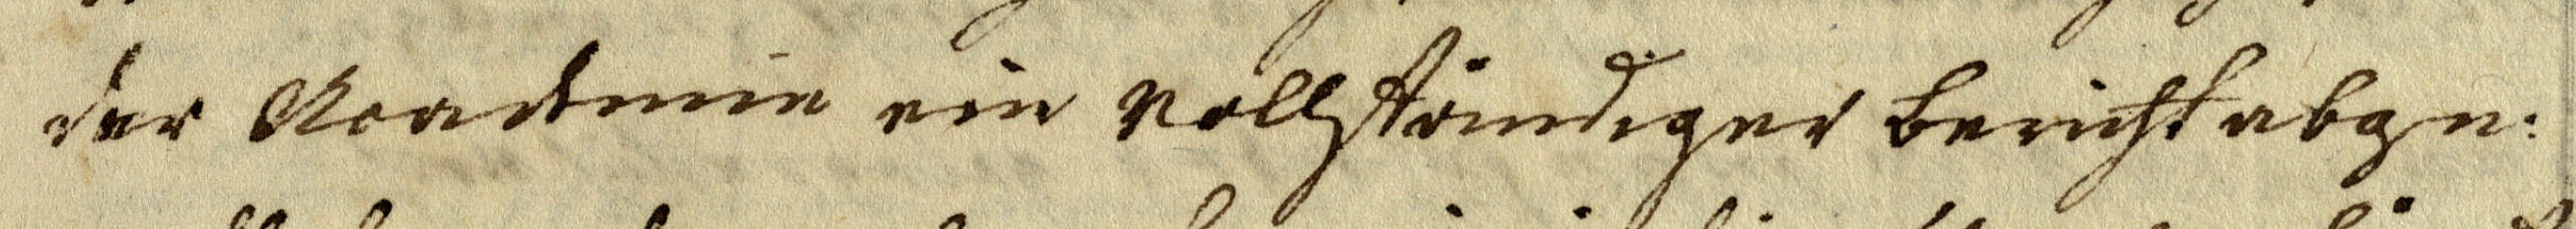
der Academie ein vollständiger Bericht abge¬
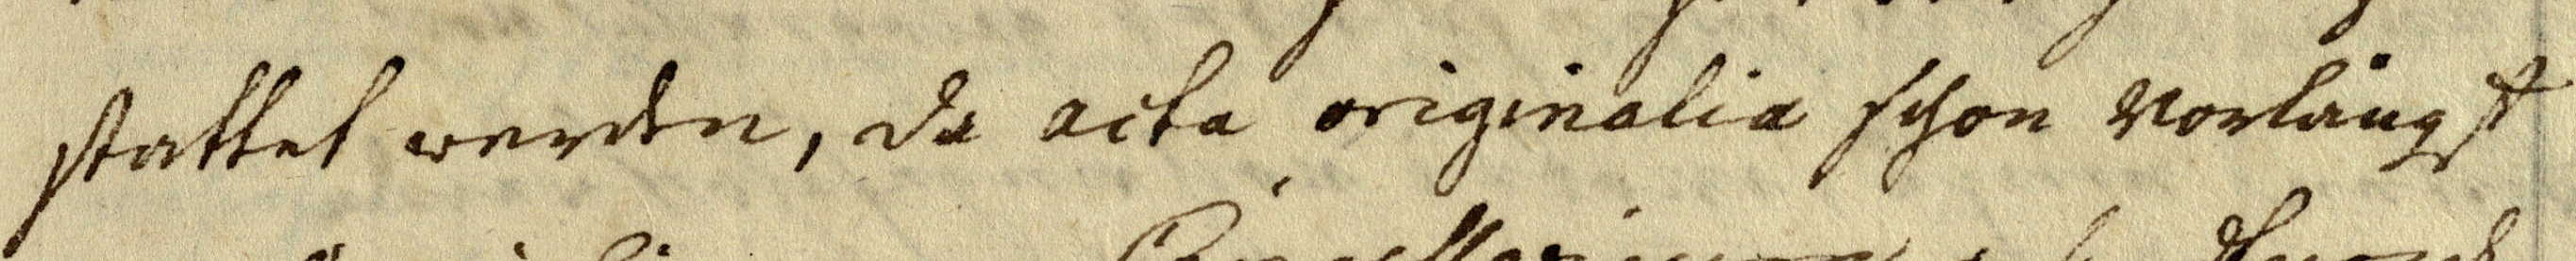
stattet werden, da acta originalia schon vorlängst
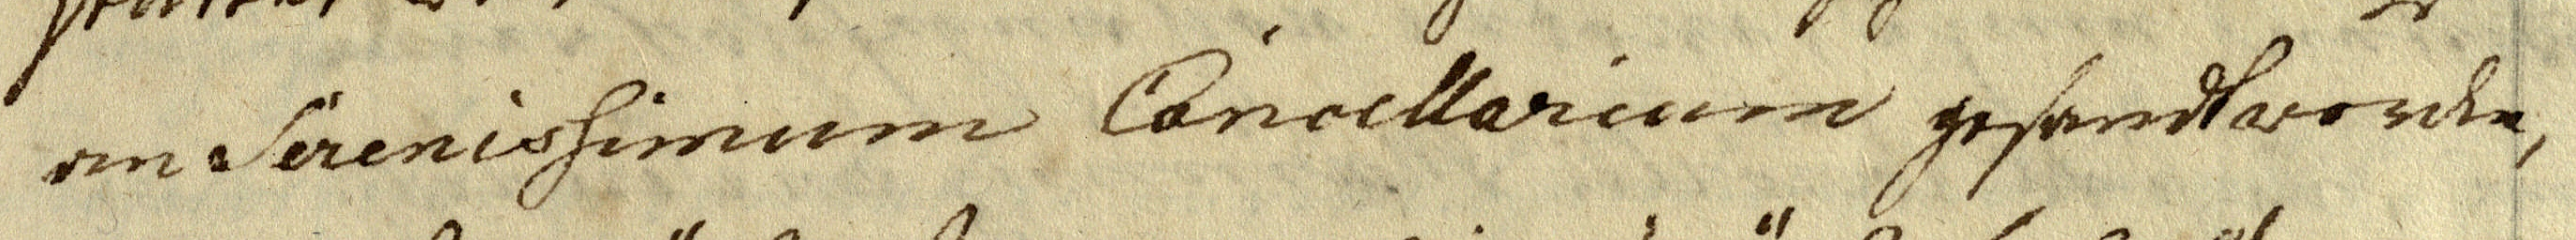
an Serenissimum Cancellarium gesandt worden,
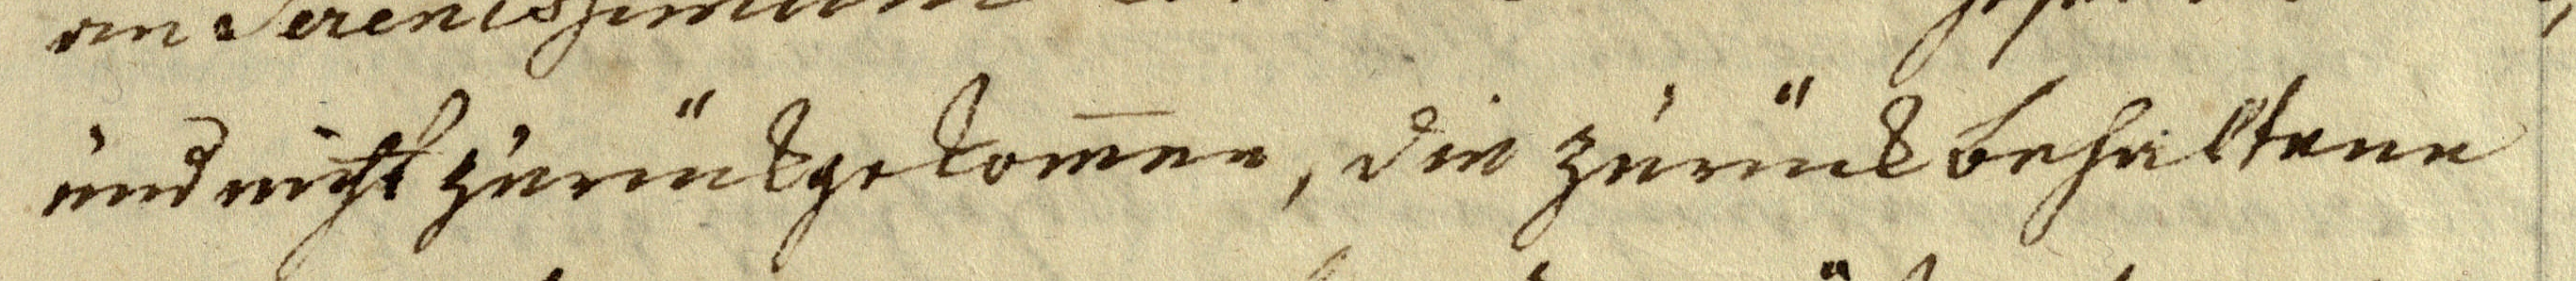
und nicht zurückgekomen, die zurückbehaltene
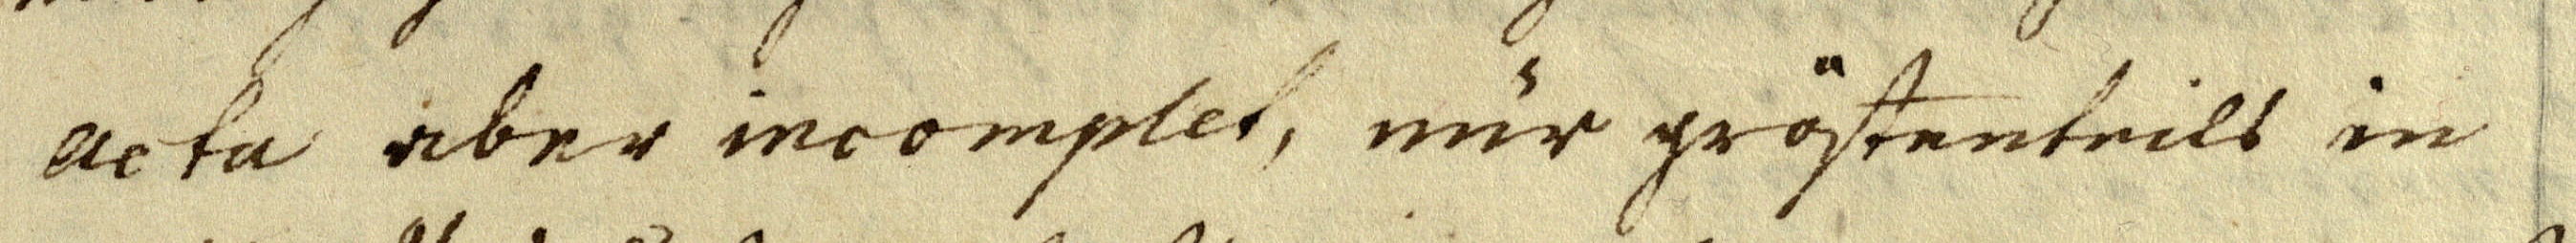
Acta aber incomplet, nur gröstenteils in
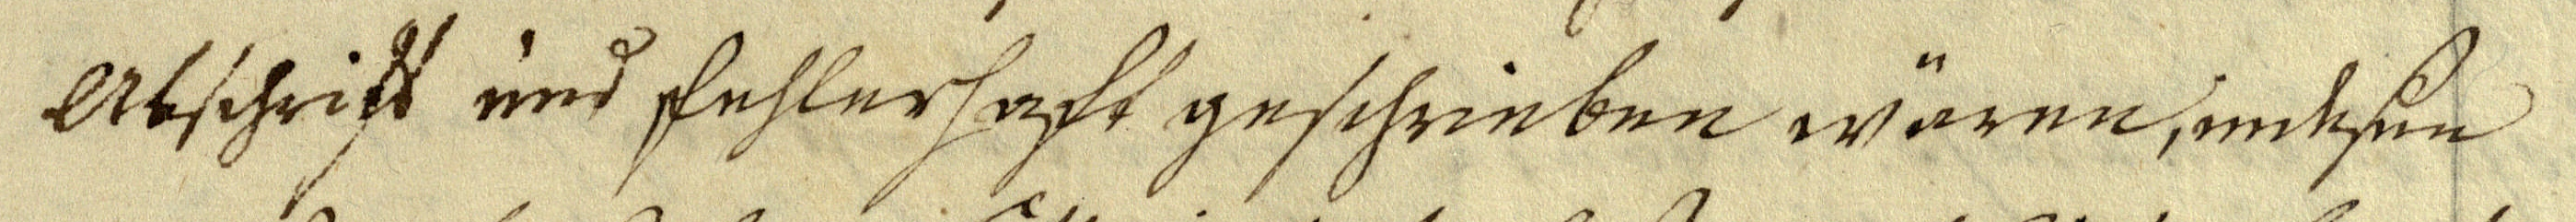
Abschrift fehlerhaft geschrieben wären, indeßen
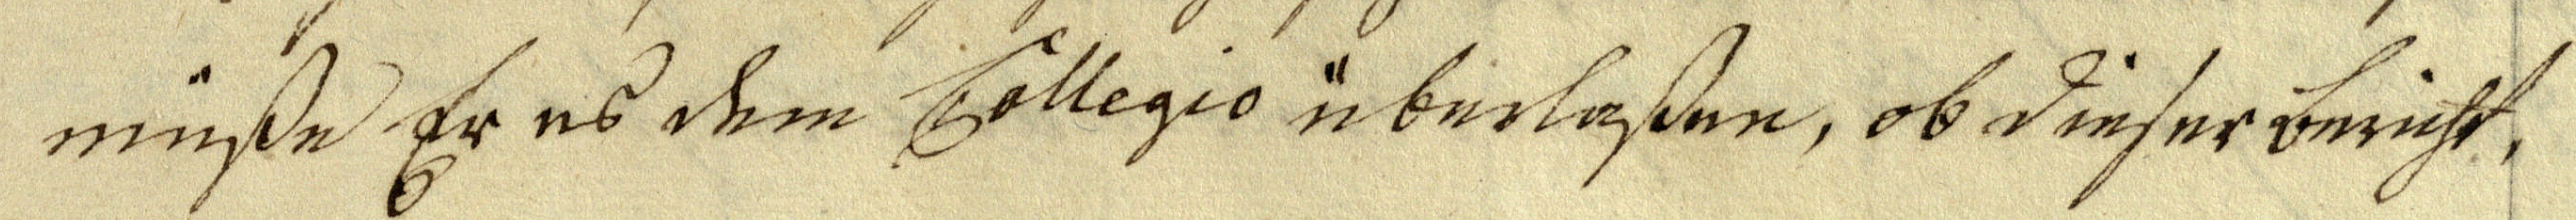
müste Er es dem Collegio überlaßen, ob dieser Bericht,
